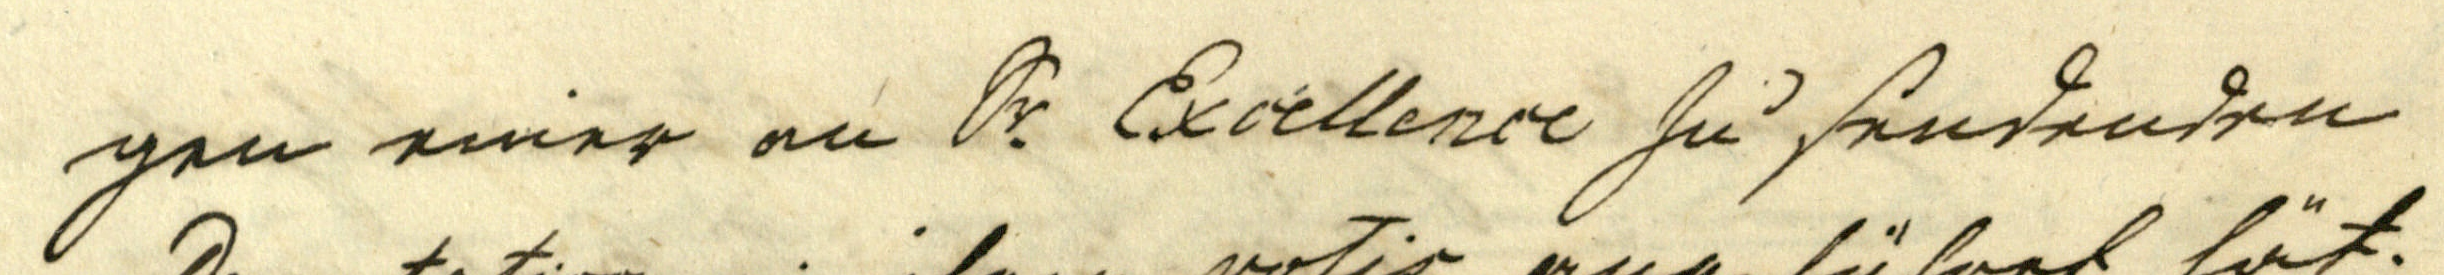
gen einer an Sr. Excellence zu sendenden
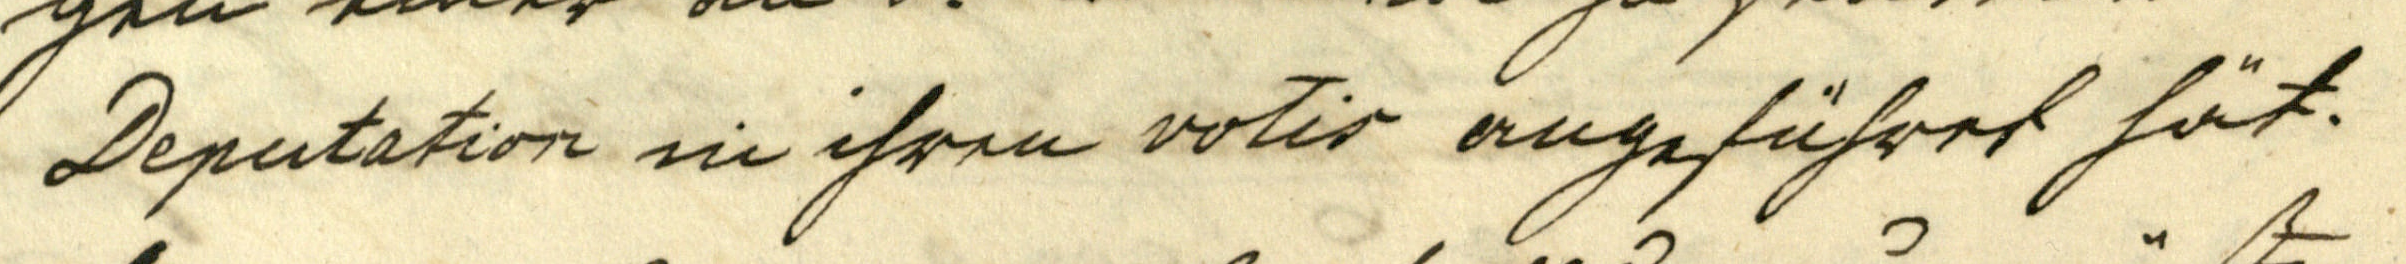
Deputation in ihren votis angeführet hät¬
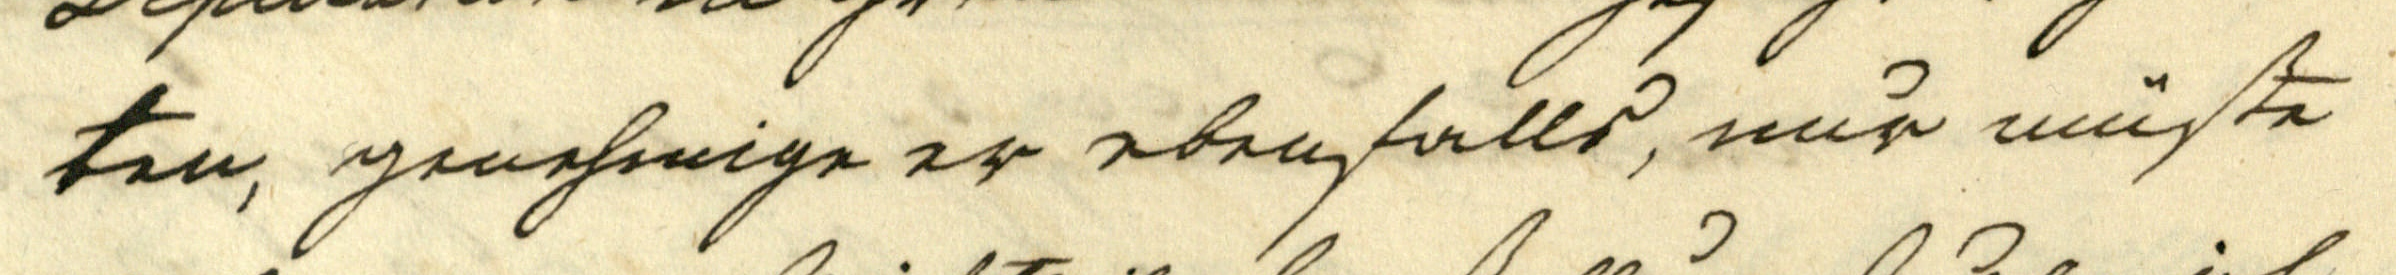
ten, genehmige er ebenfalls, nur müßte
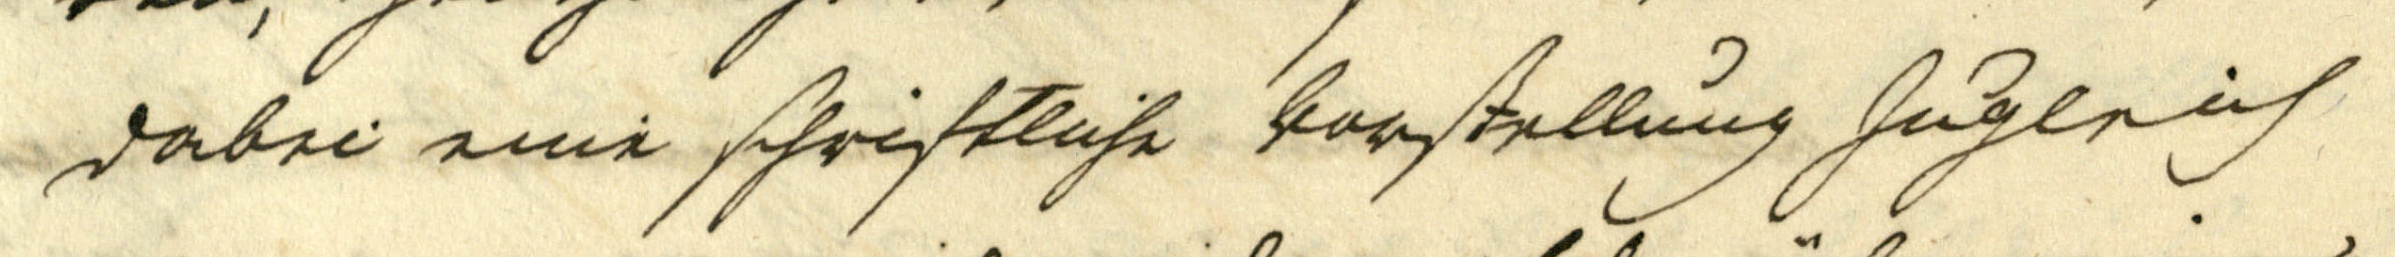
dabei eine schriftliche Vorstellung zugleich
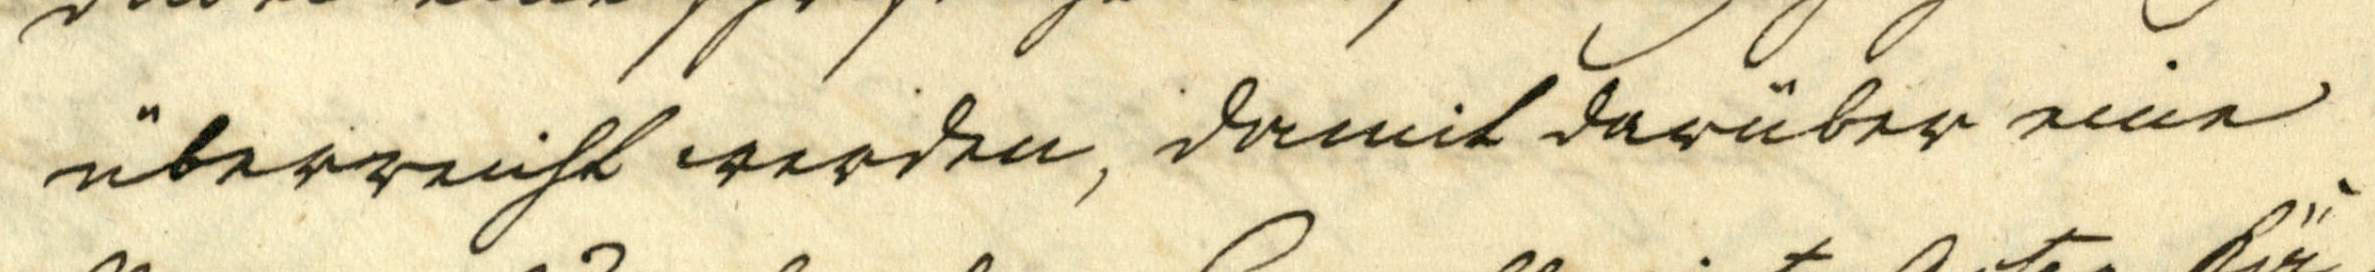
überreicht werden, damit darüber eine
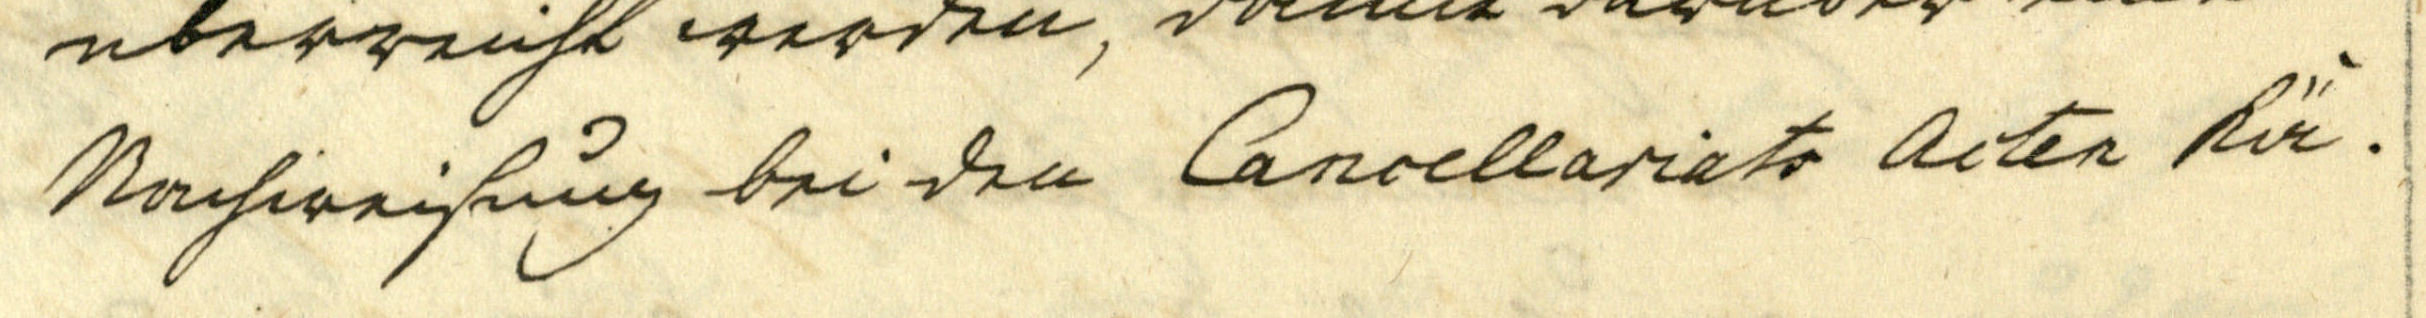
Nachweisung bei den Cancellariats Acten kä¬
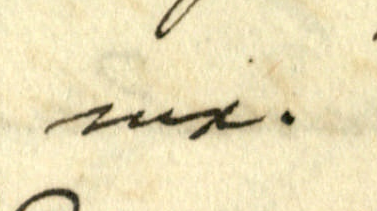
me.
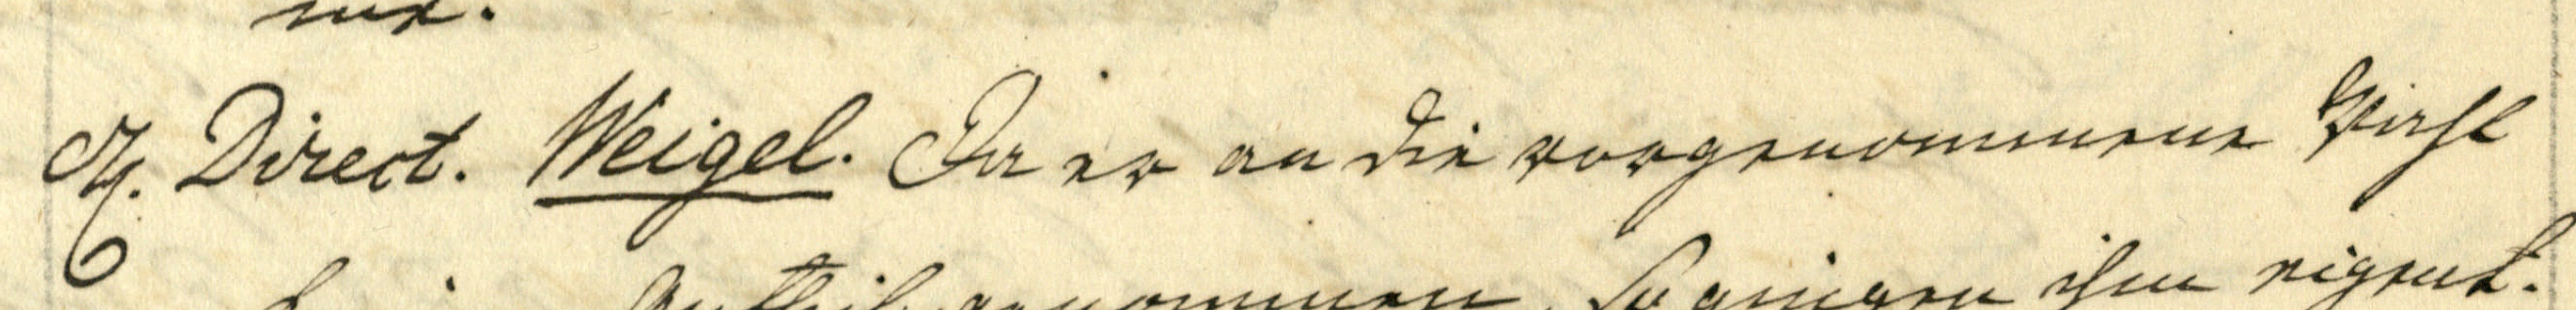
dh. Direct. Weigel. Da er an die vorgenommene Wahl
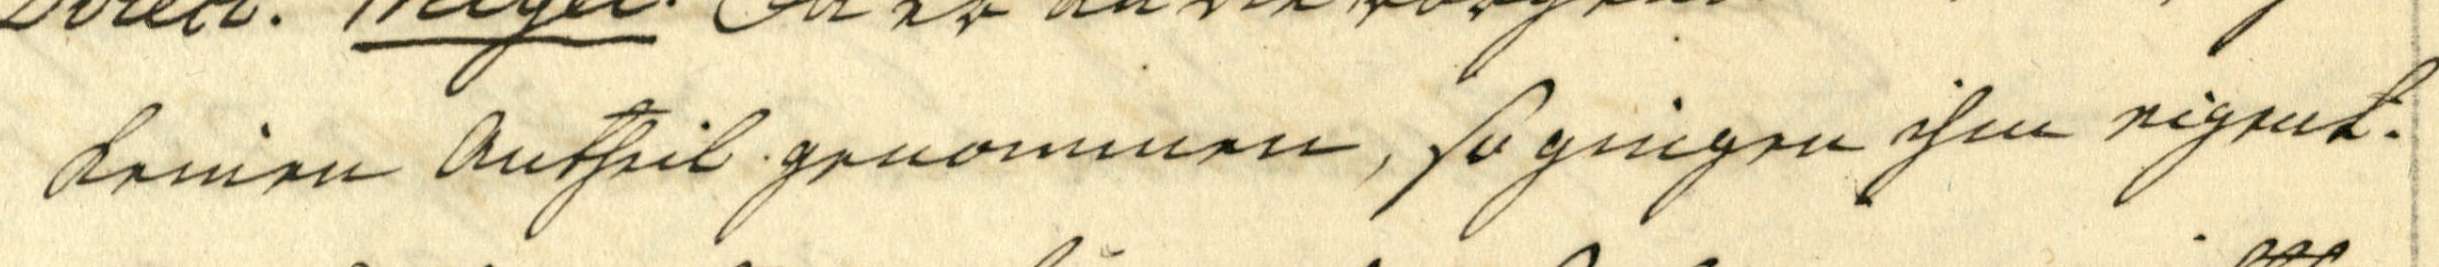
keinen Antheil genommen, so gingen ihm eigent¬
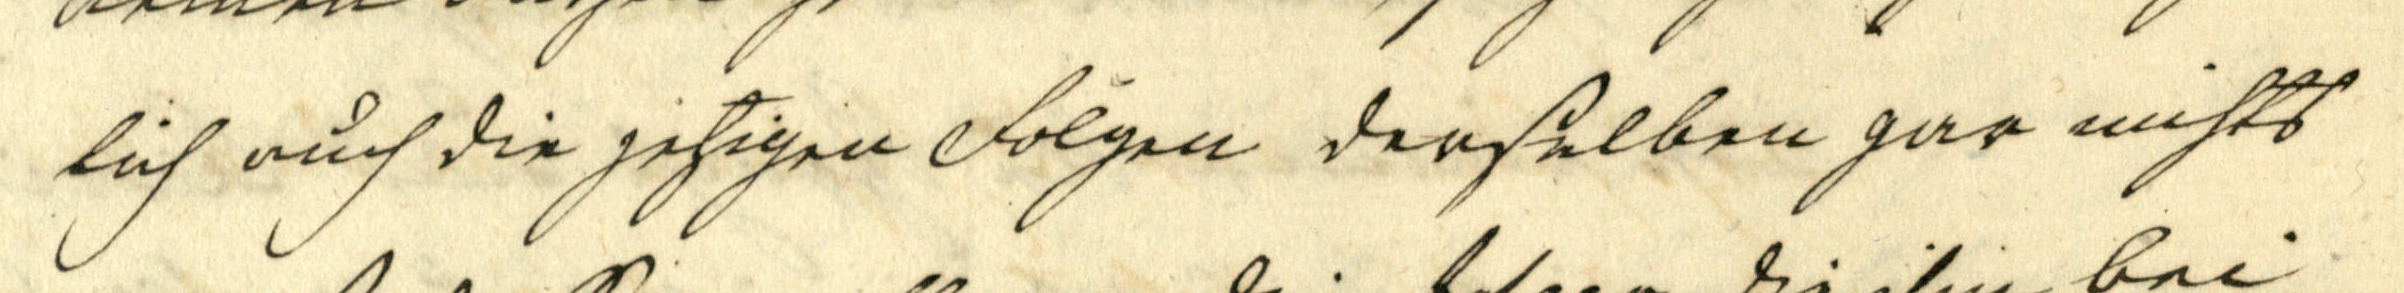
lich auch die jetzigen Folgen derselben gar nichts
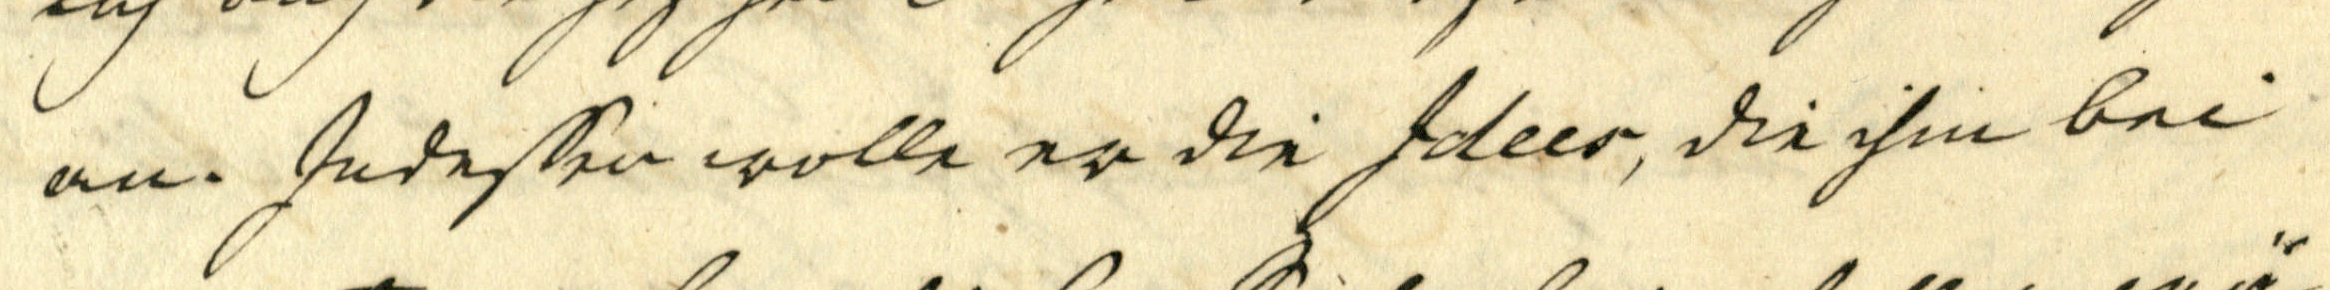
an. Indessen wolle er die Idees, die ihm bei
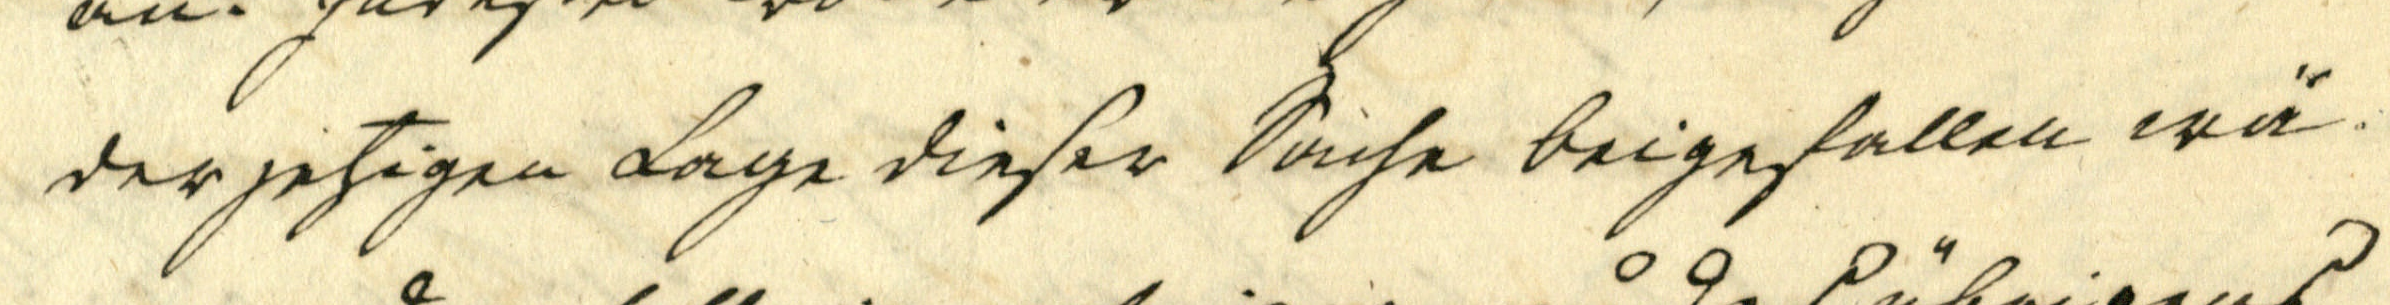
der jetzigen Lage dieser Sache beigefallen wä¬
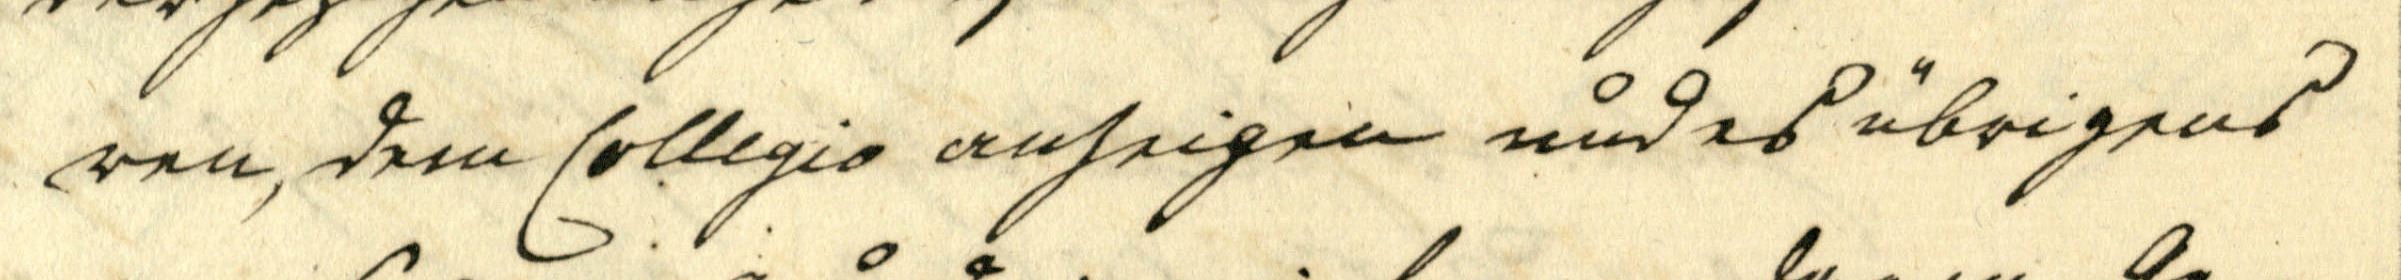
ren, dem Collegio anzeigen und es übrigens
